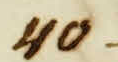40
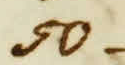50
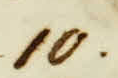10
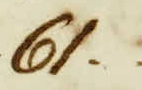61.
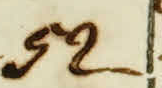52
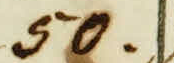50.
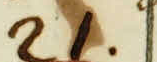21.
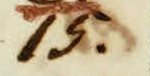15.
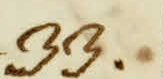33.
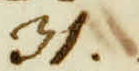31.
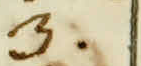3.
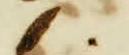1.
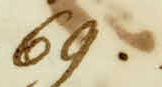69.
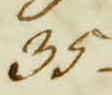35
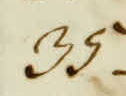35
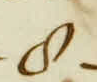8
